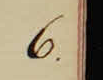6.
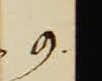9.
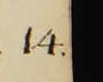14.
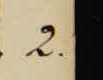2.
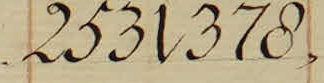2531378
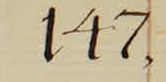147
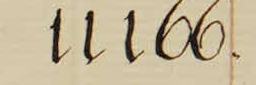11166
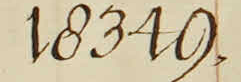18349
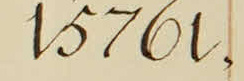15761
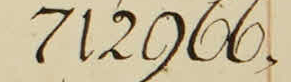712966
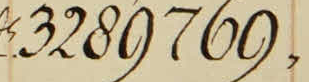3289769
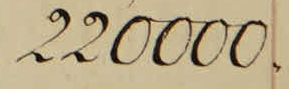220000
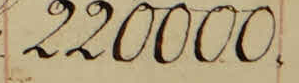220000
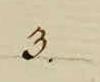3.
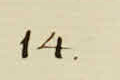14.
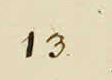13.
